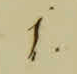1
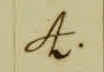4
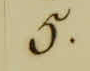5
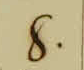8
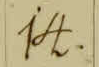14
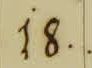18
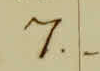7.
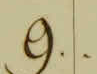9.
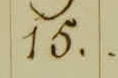15.
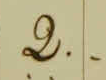2.
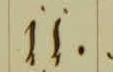11.
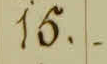15.
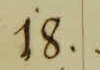18.
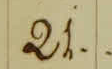21.
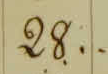28.
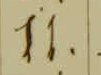11.
